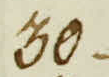30
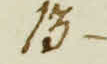13
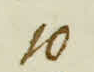10
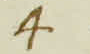4
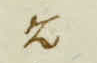2
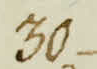30
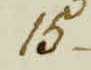15
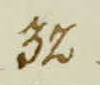32
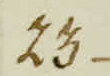23
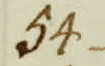54
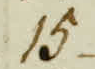15
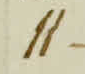11
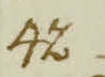42
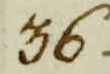36
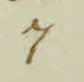7
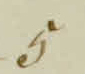5
